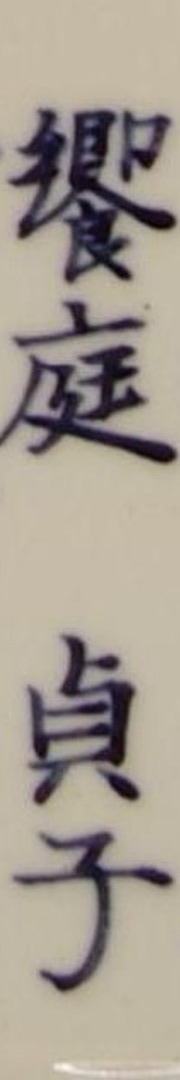饗庭貞子
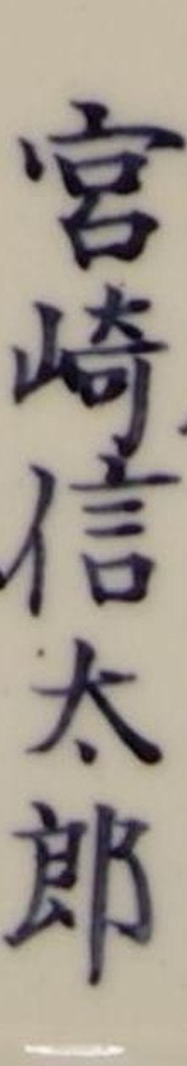宮崎信太郎
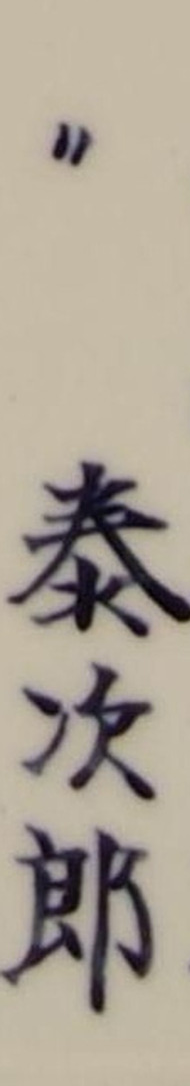泰次郎
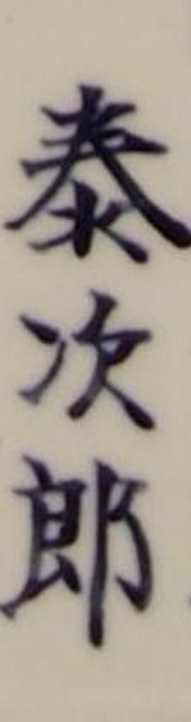泰次郎
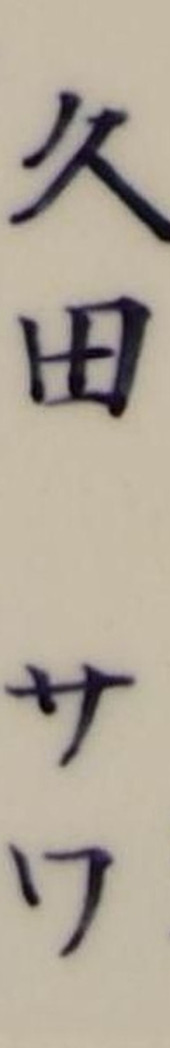久田サワ
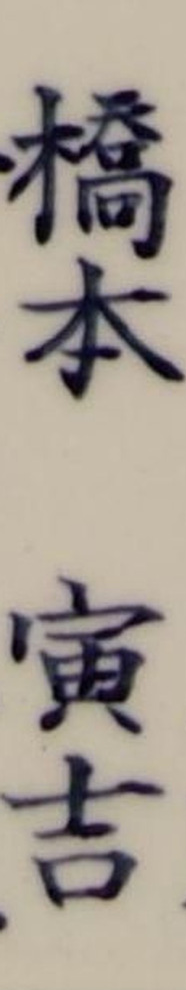橋本寅吉
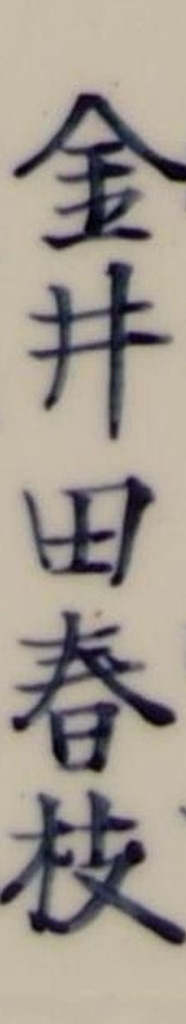金井田春校
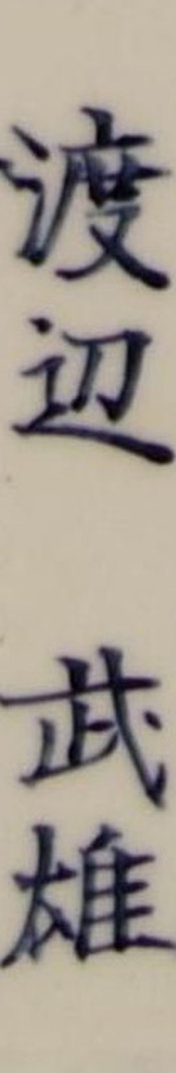渡辺武雄
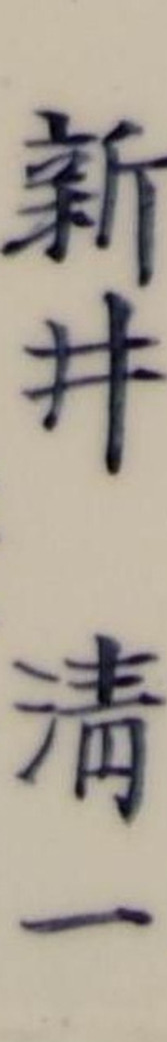新井清一
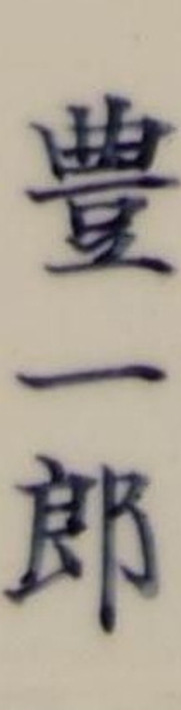豊一郎
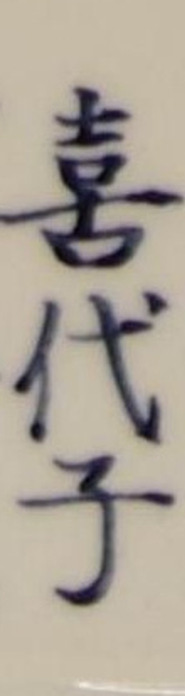喜代子
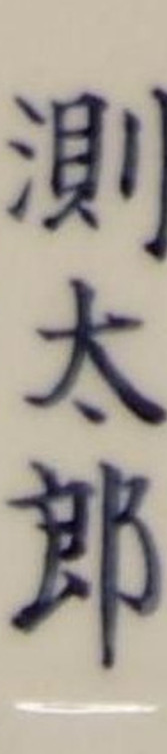測太郎
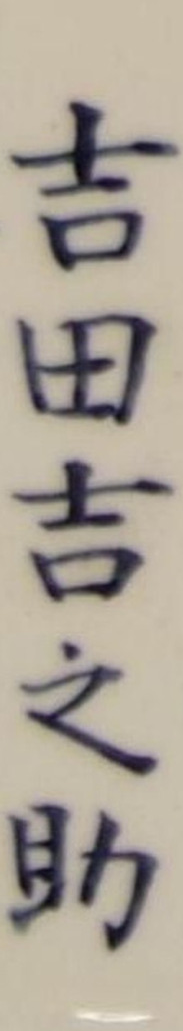吉田吉之助
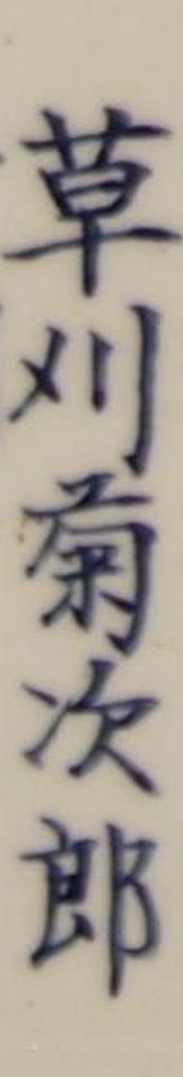草刈菊次郎
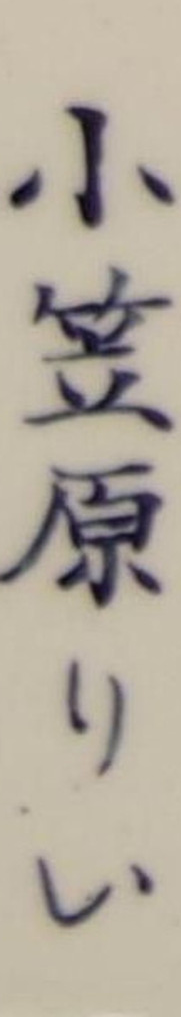小笠原りい
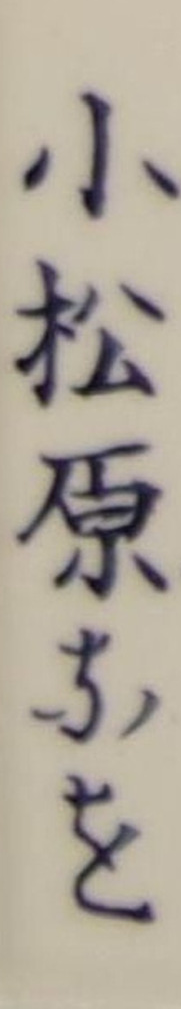小松原なを
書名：M~S
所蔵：高野山金剛峯寺
